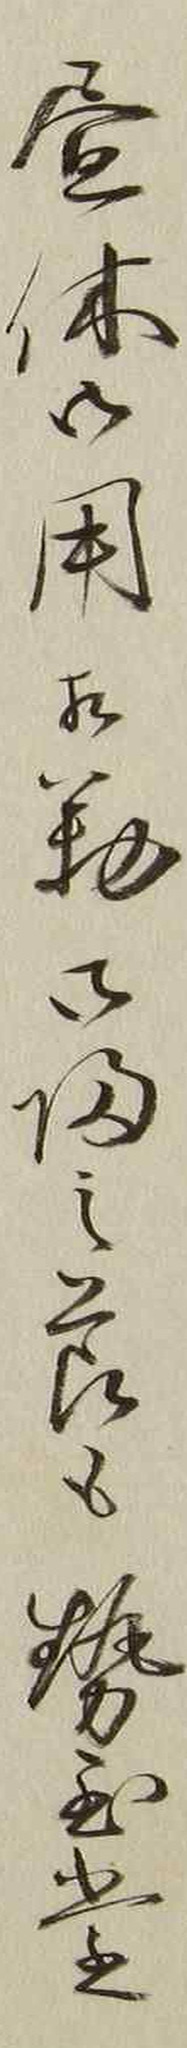昼休御用相勤御帰之節も勢国堂
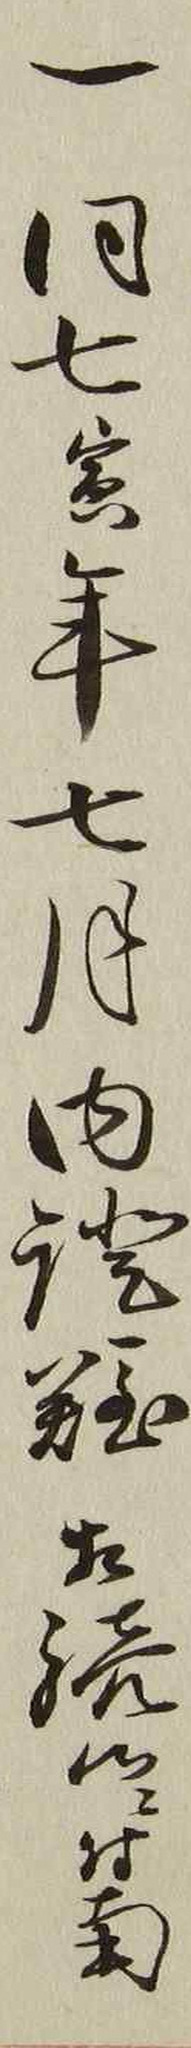一同七寅年七月内証難相続候ニ付南
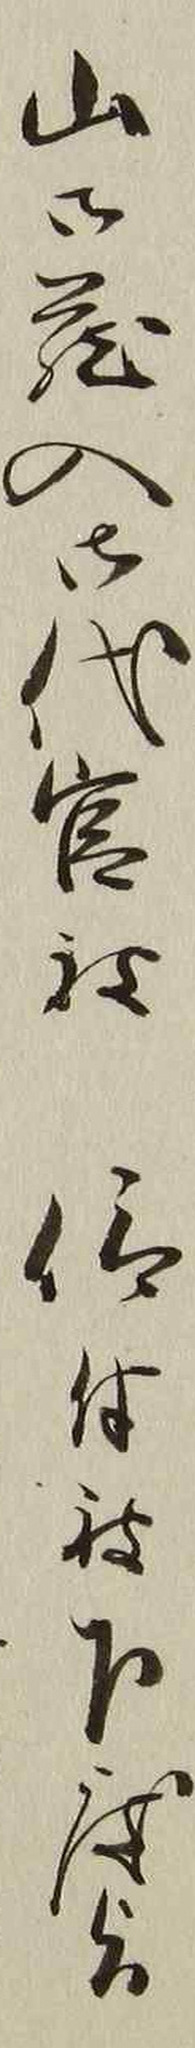山御蔵入御代官被仰付被下度旨
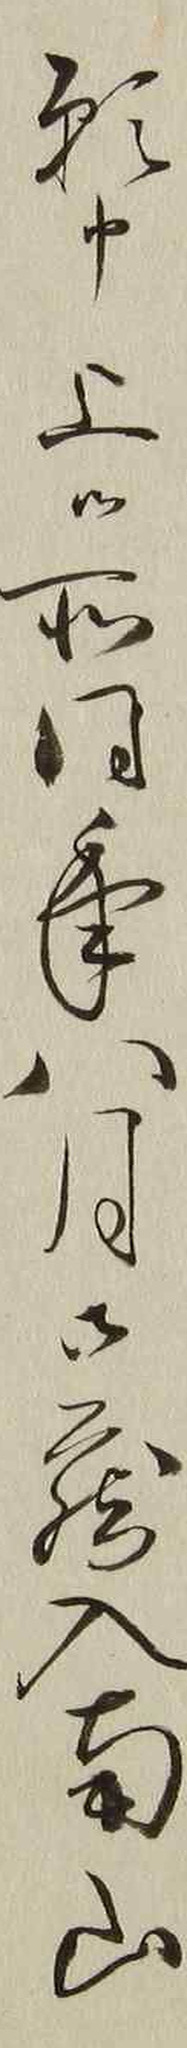願申上候所同年八月御蔵入南山
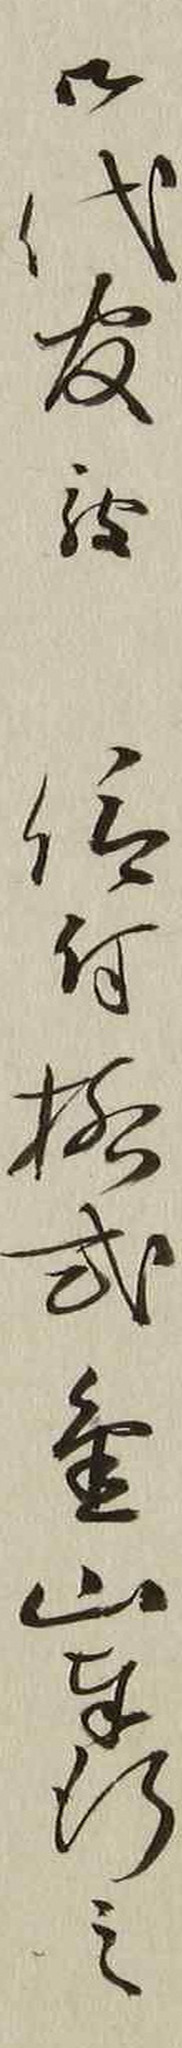御代官被仰付格式金山奉行之
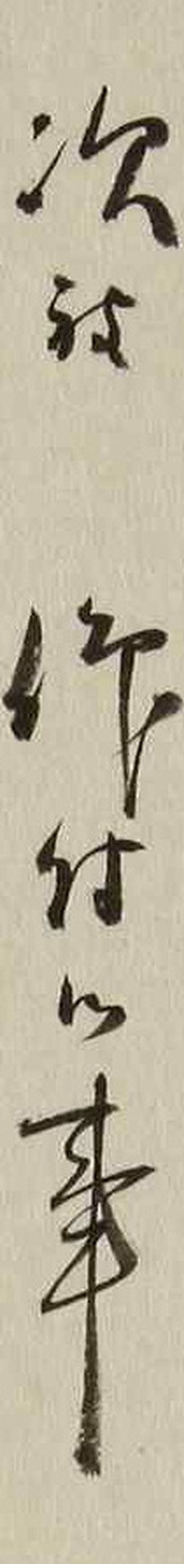次被仰付候事
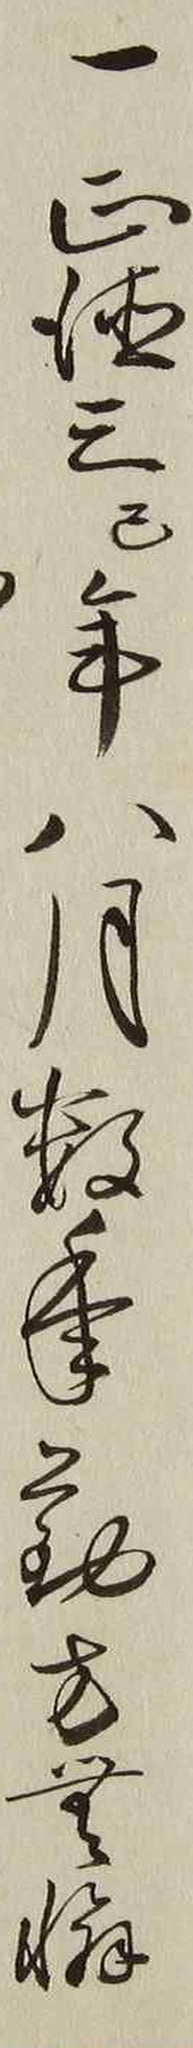一正徳三巳年八月数年勤方無懈
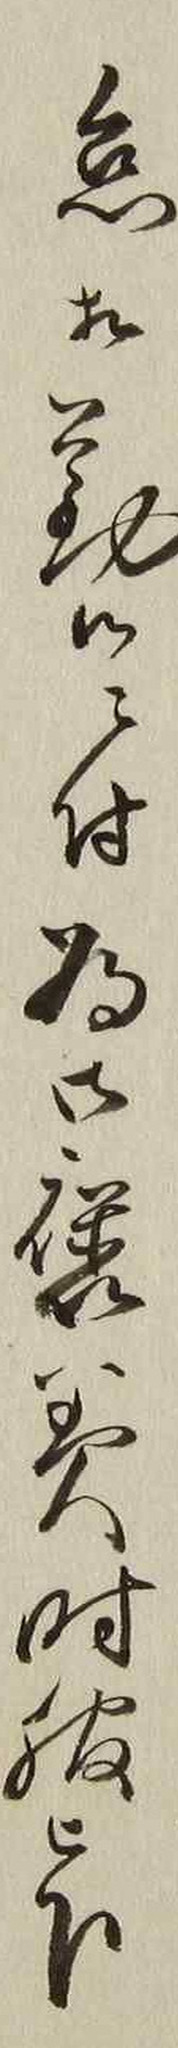怠相勤候ニ付為御褒美時服被下
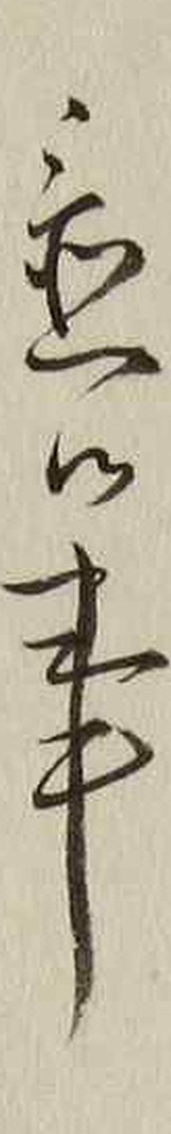置候事
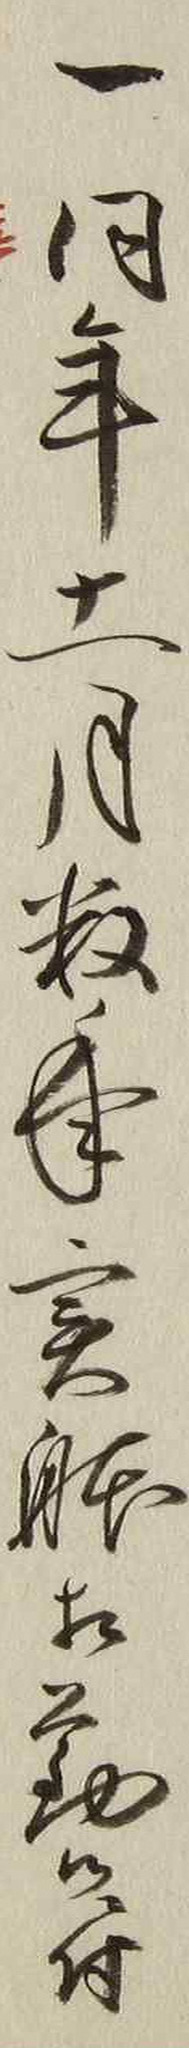一同年十一月数年実体相勤候ニ付
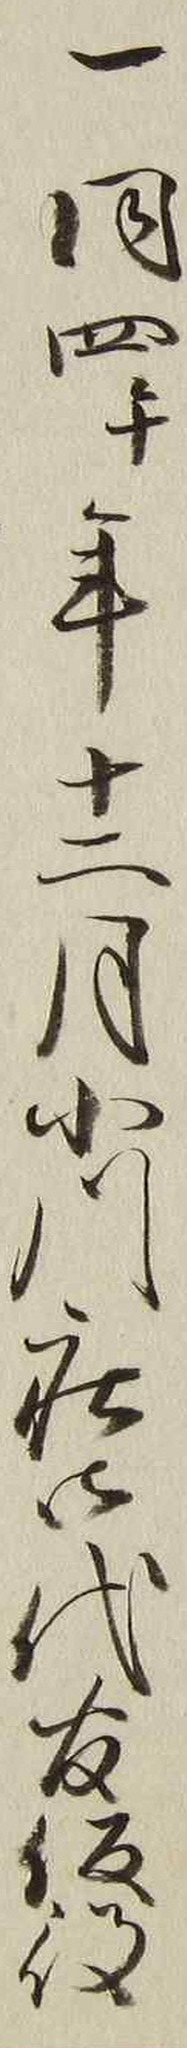一同四午年十二月小川庄御代官仮役
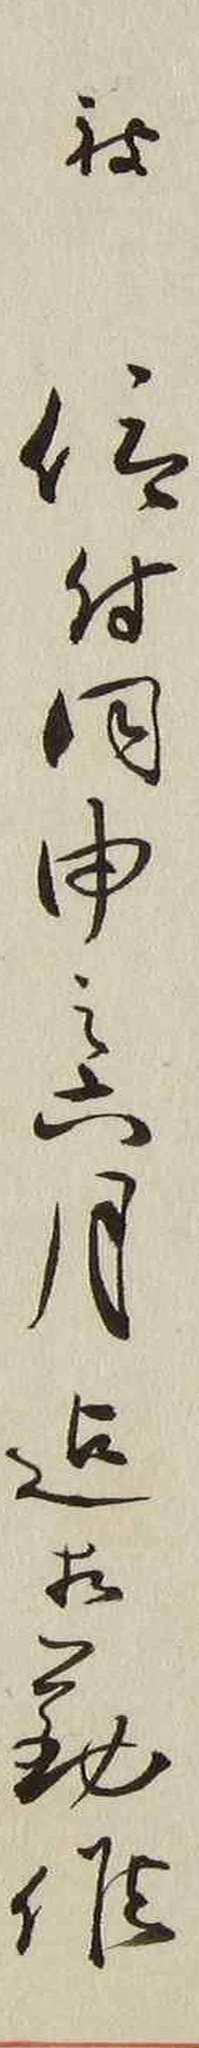被仰付同申之六月迄相勤候事
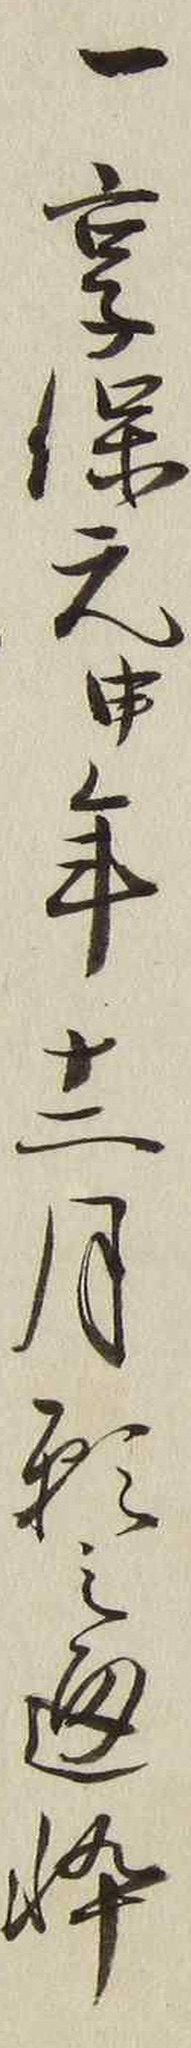一享保元申年十二月願之通忰
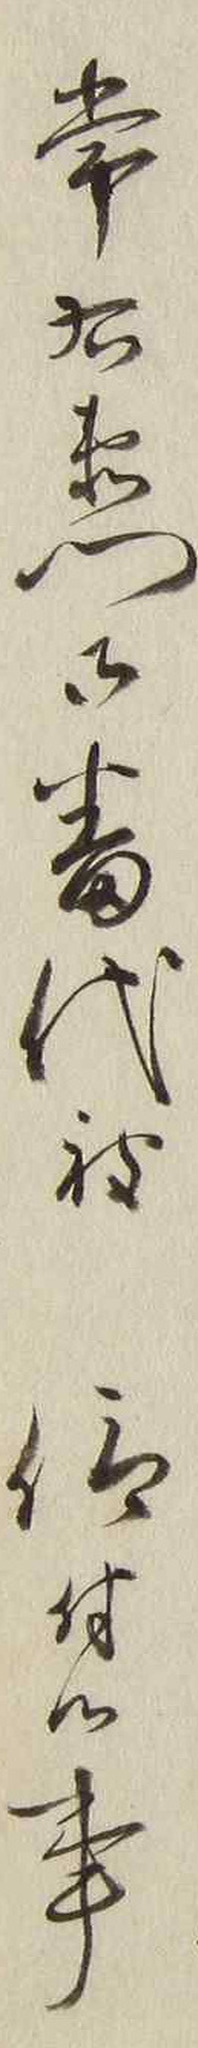常右衛門御番代被仰付候事

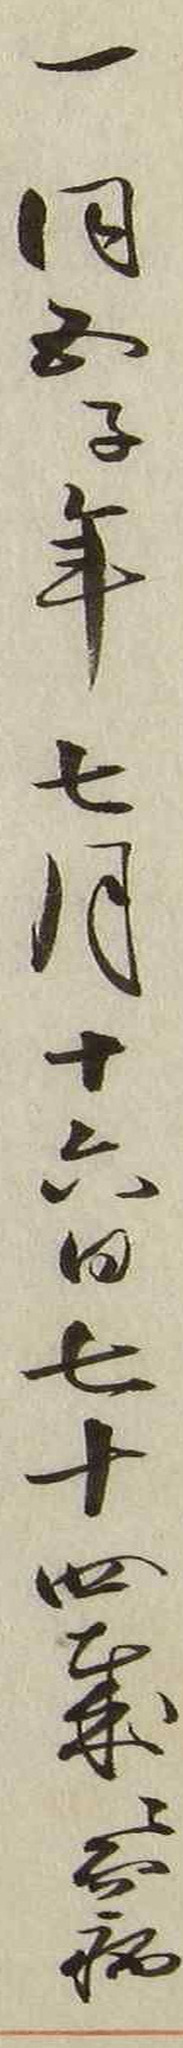一同五子年七月十六日七十四歳ニ而病
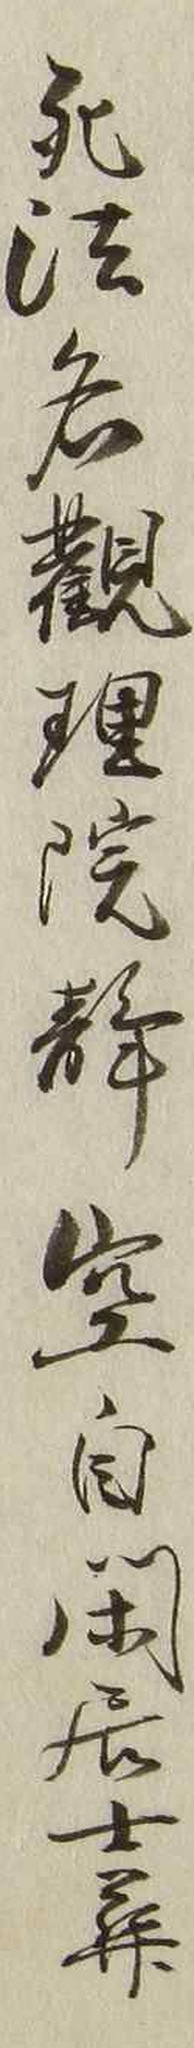死法名観理院静空自閑居士葬
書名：諸士系譜　巻之163　な之部5
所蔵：会津若松市立会津図書館
